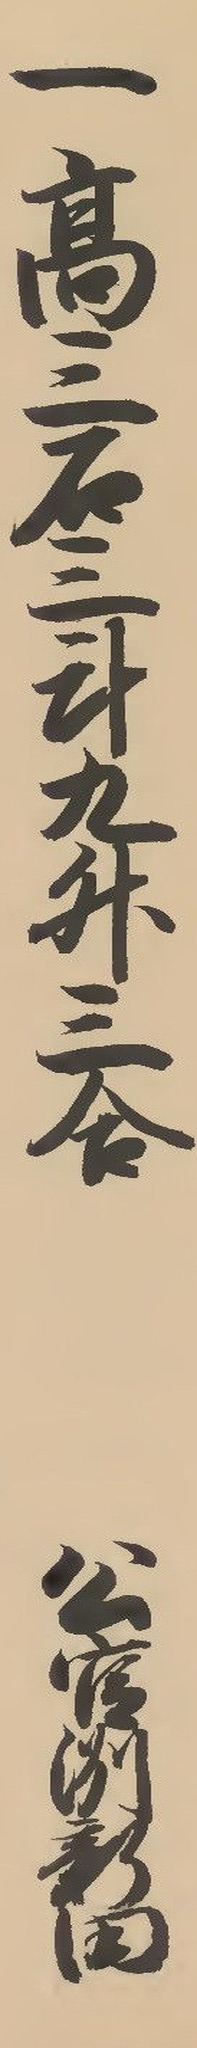一高三石三斗九升三合公官洲新田
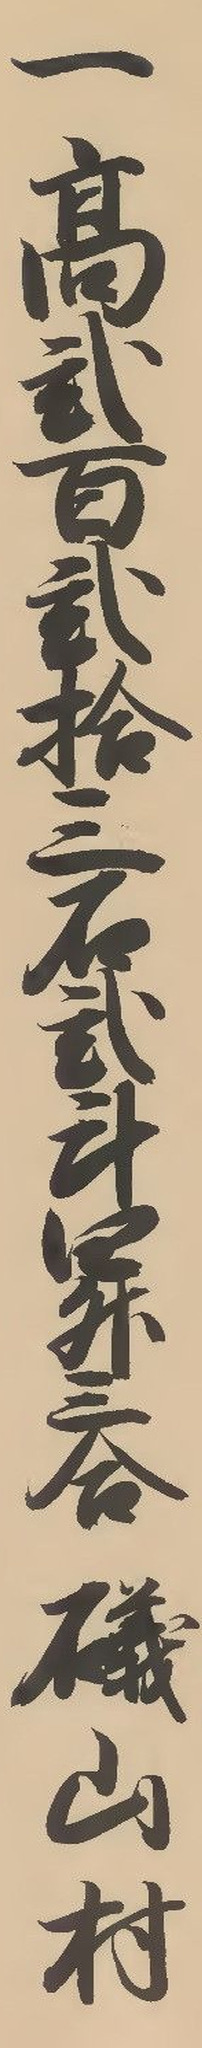一高弐百弐拾三石弐斗四升三合磯山村
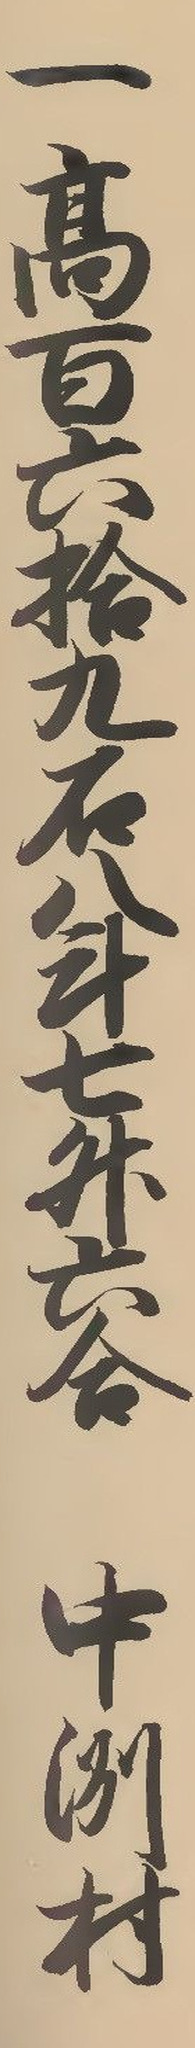一高百六拾九石八斗七升六合中洲村
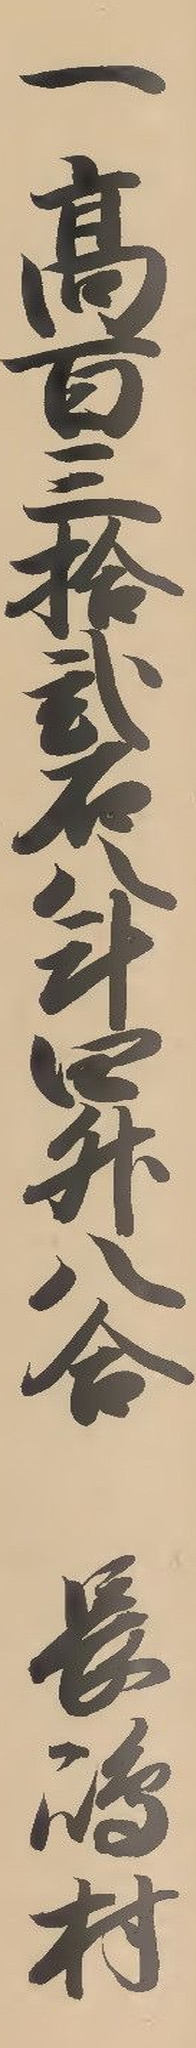一高百三拾弐石八斗四升八合長島村
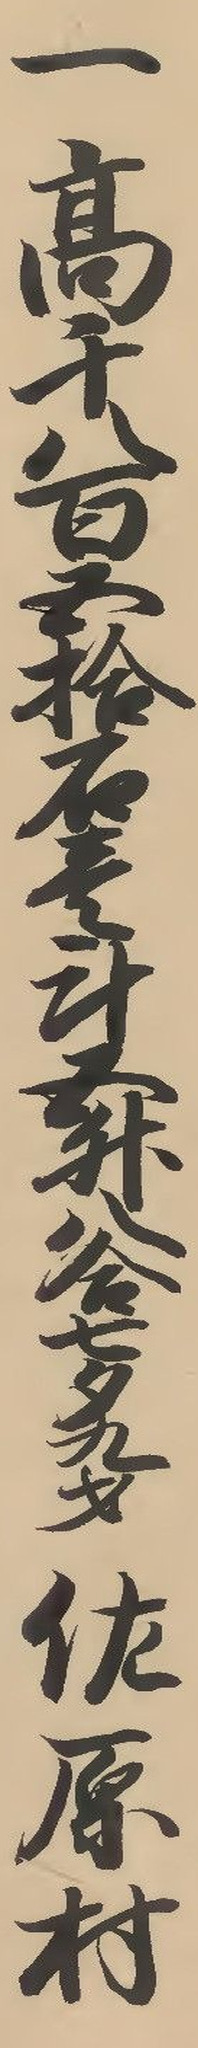一高千八百五拾石壱斗五升八合七勺九才佐原村
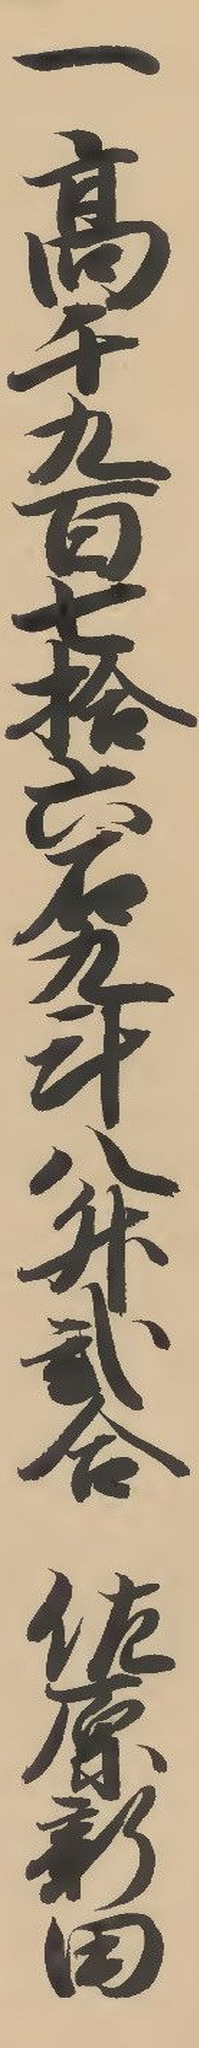一高千九百七拾六石九斗八升弐合佐原新田
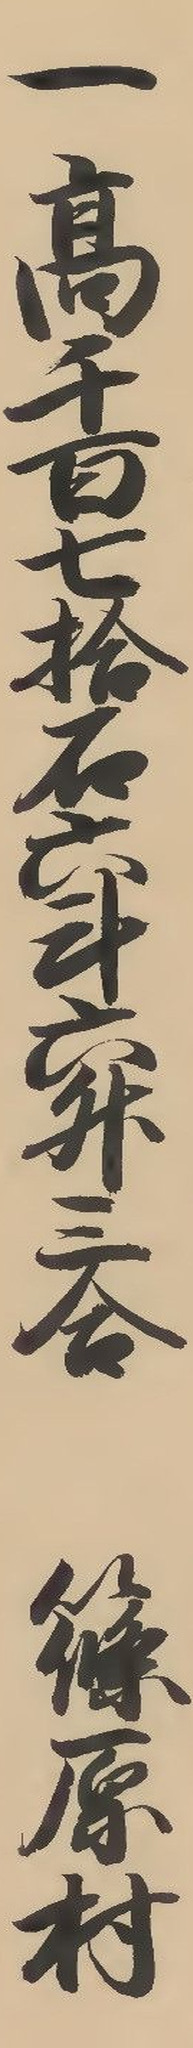一高千百七拾石六斗六升三合篠原村

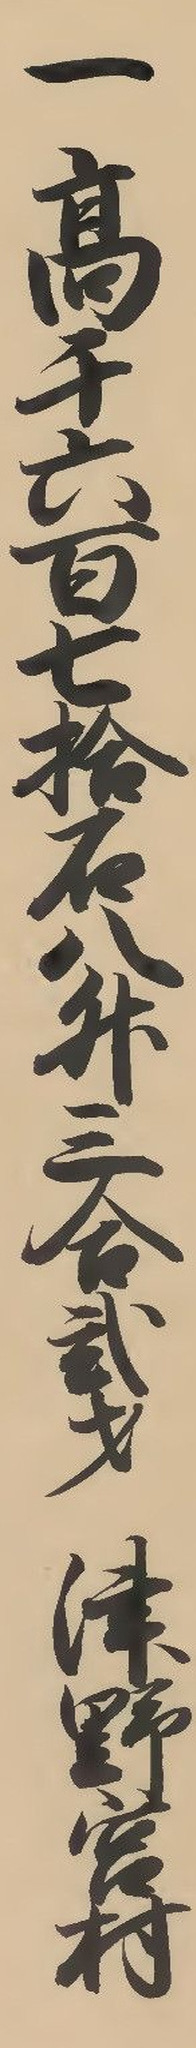一高千六百七拾石八升三合弐才津野宮村
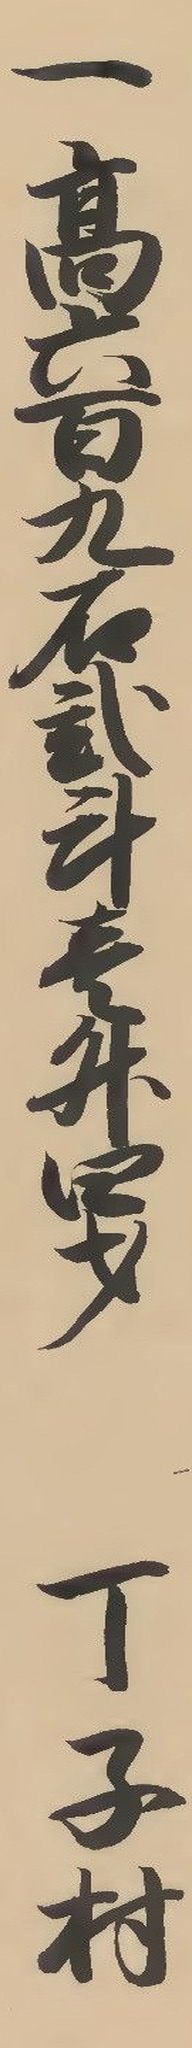一高六百九石弐斗壱升四才丁子村
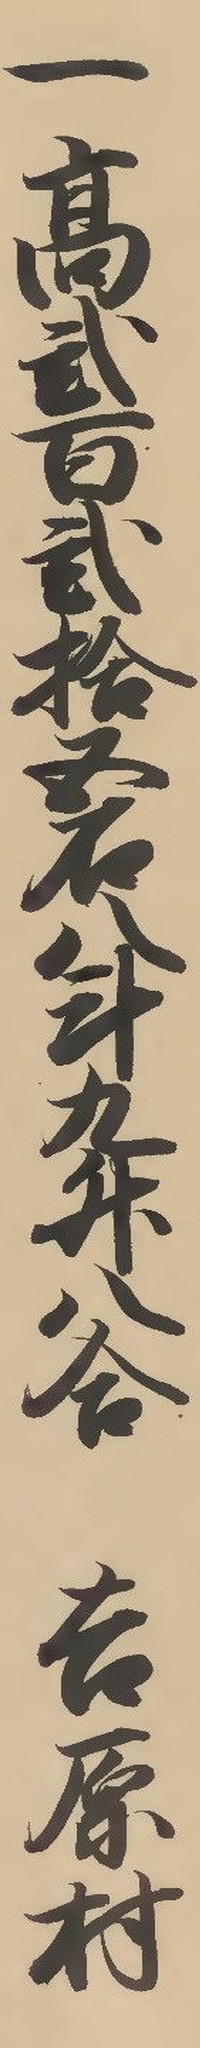一高弐百弐拾五石八斗九升八合吉原村
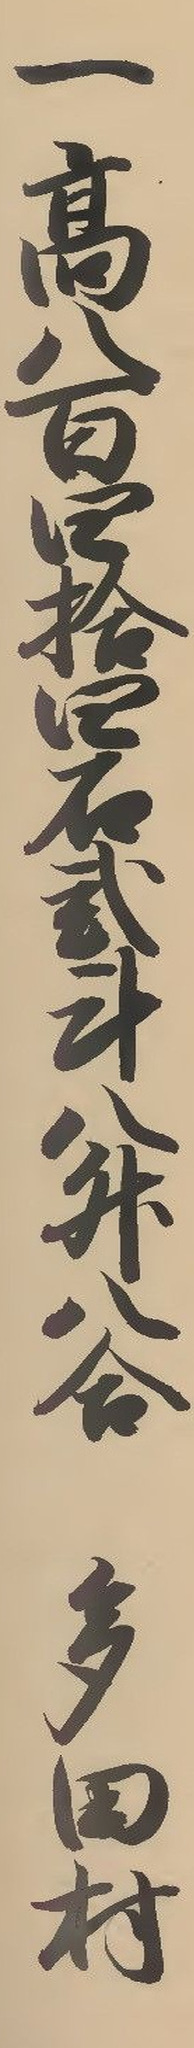一高八百四拾四石弐斗八升八合多田村
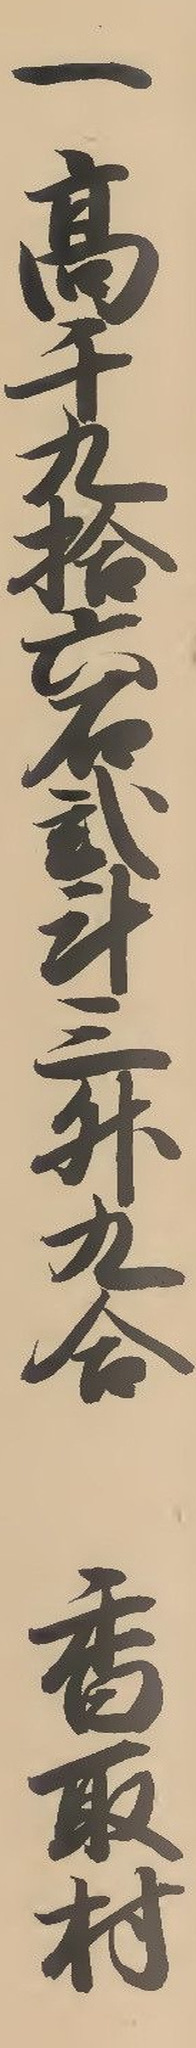一高千九拾六石弐斗三升九合香取村
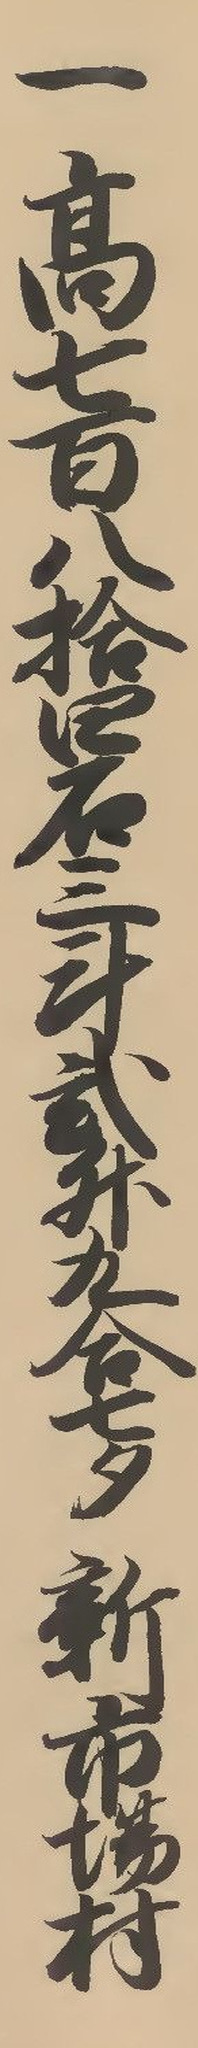一高七百八拾四石三斗弐升九合七勺新市場村

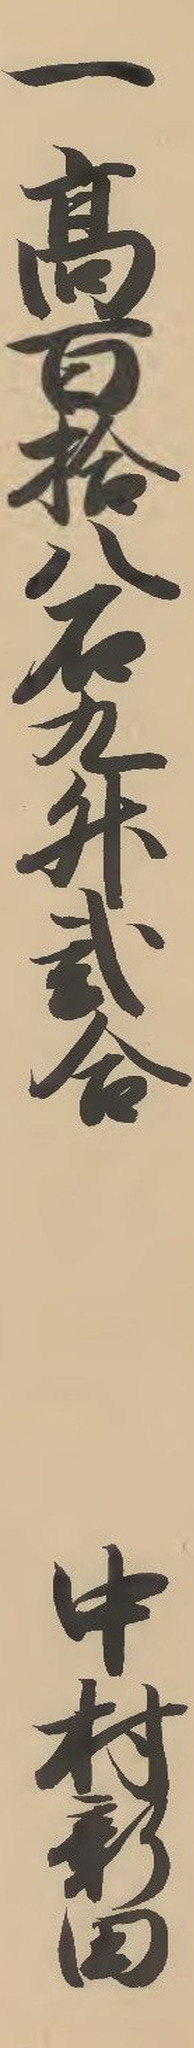一高百拾八石九升弐合中村新田
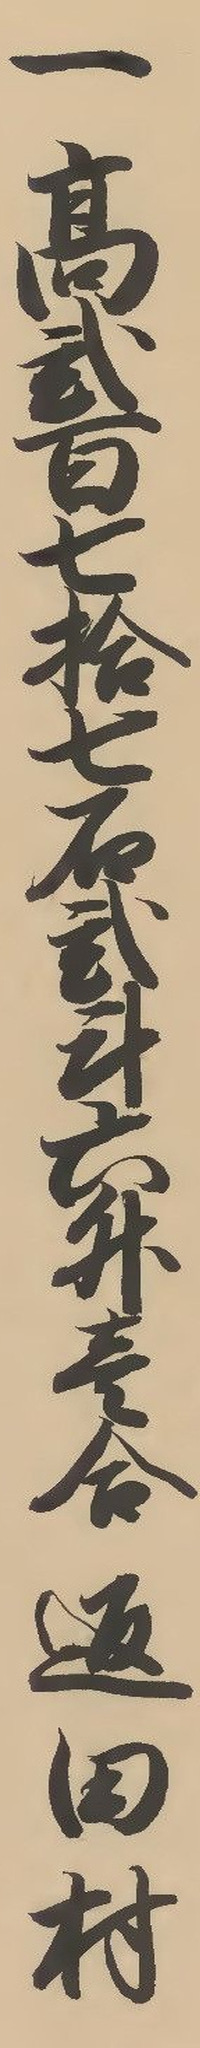一高弐百七拾七石弐斗六升壱合返田村
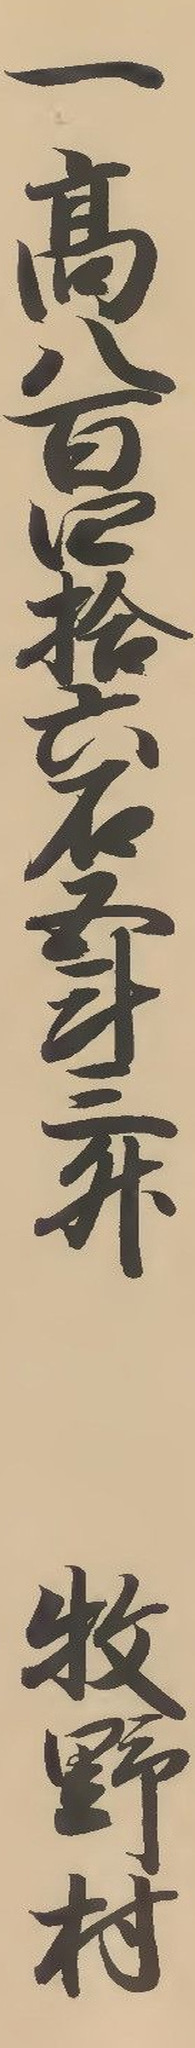一高八百四拾六石五斗三升牧野村
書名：下総国郷帳
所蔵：国立公文書館 National Archives of Japan
